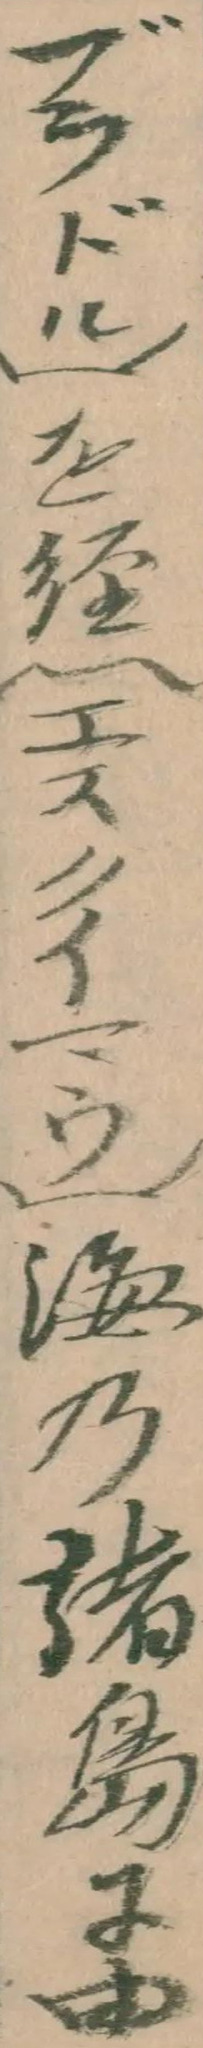ブラドル)を経(エスクイマウ)海の諸島に由
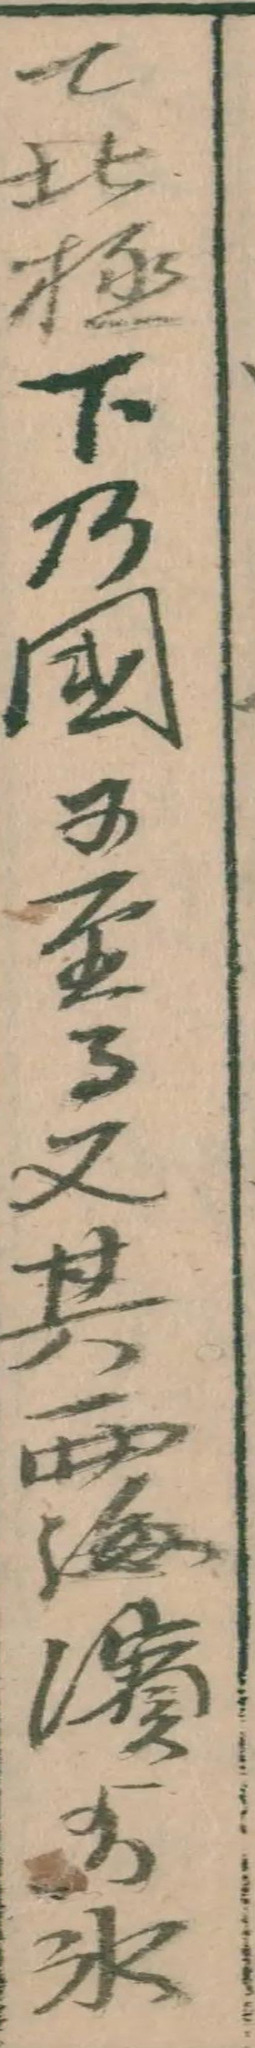て北極下の国に至る又其西海浜より氷
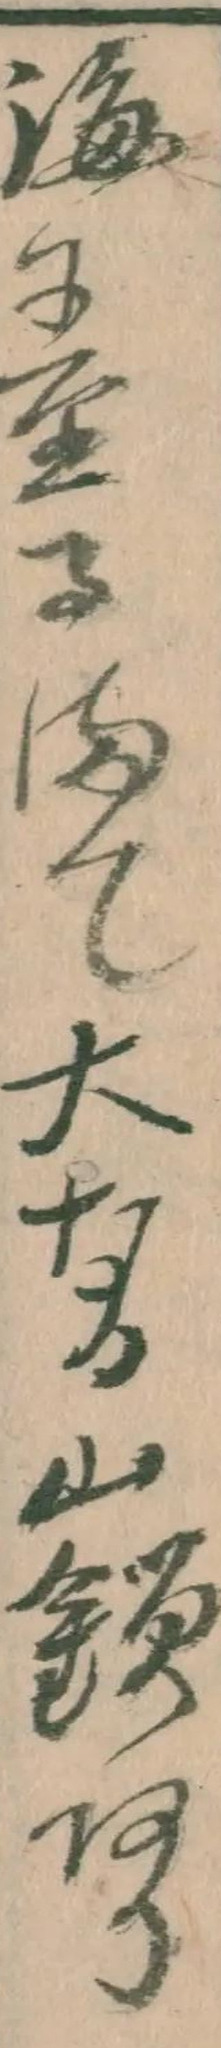海に至るまて大なる山鎖あり
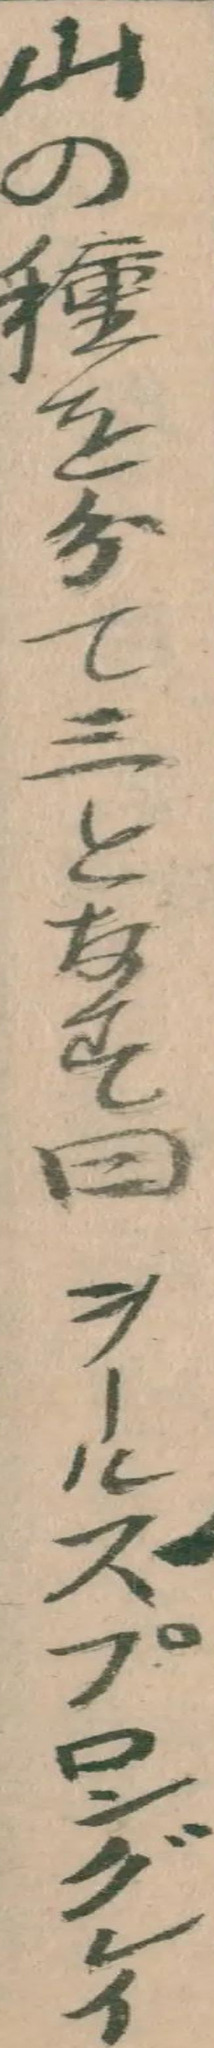山の種を分て三となす曰ヲールスプロングレイ
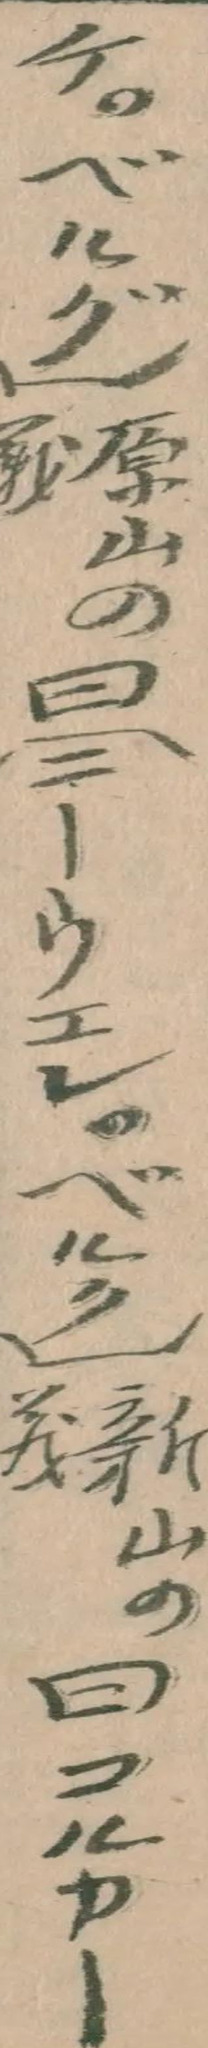ケ・ベルグ)原山の義曰(ニーウエレ・ベルク)新山の義曰コルカー
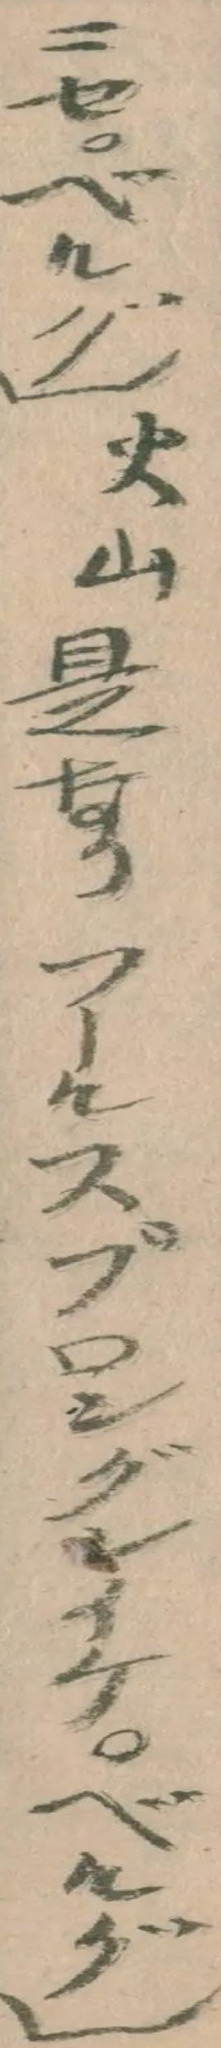ニセ・ベルグ)火山是なりフールスプロングレイケ・ベルグ)
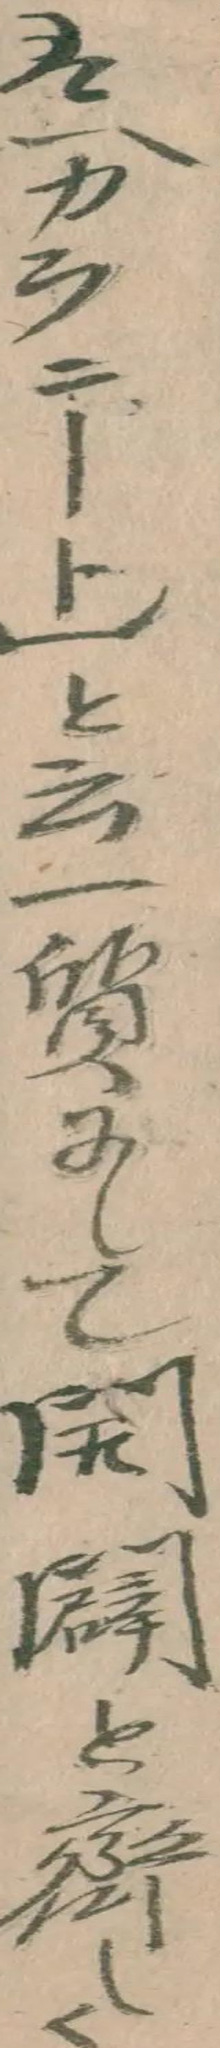は(カラニート)と云一質にして開闢と斉しく
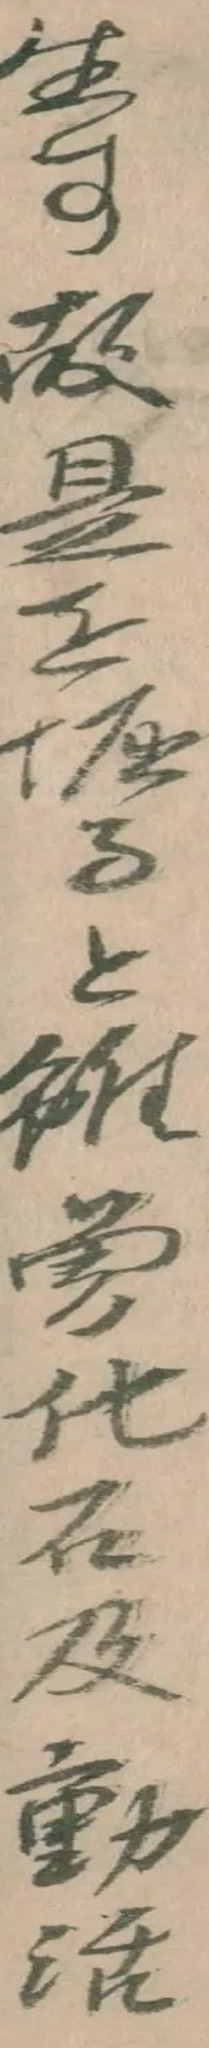生す故是を掘ると雖曽化石及動活

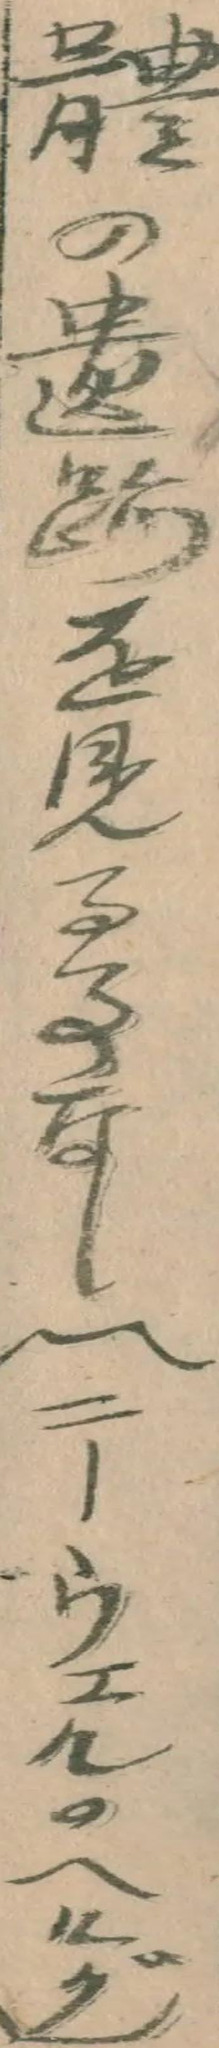体の遺跡を見る事なし(ニーウェル・ヘルグ)
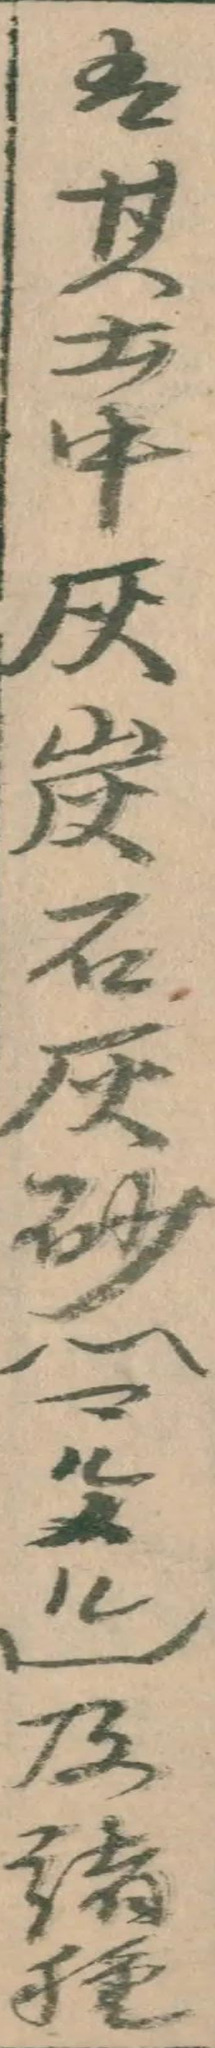は其土中灰炭石灰砂(マルメル)及諸種
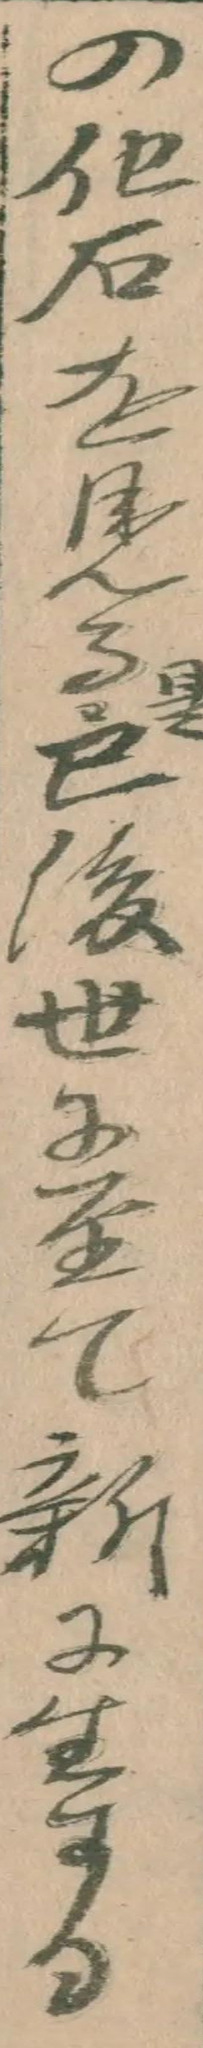の化石を見る是已後世に至て新に生する
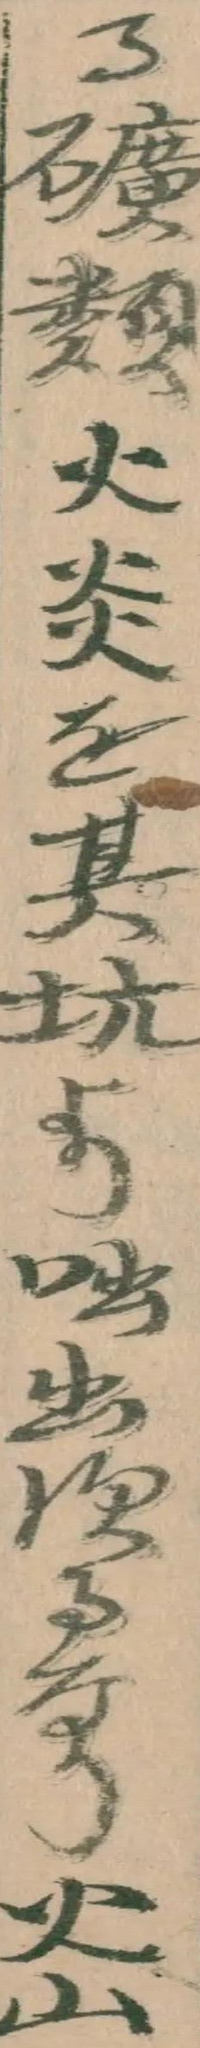る礦類火炎を其坑より咄出するなり火山
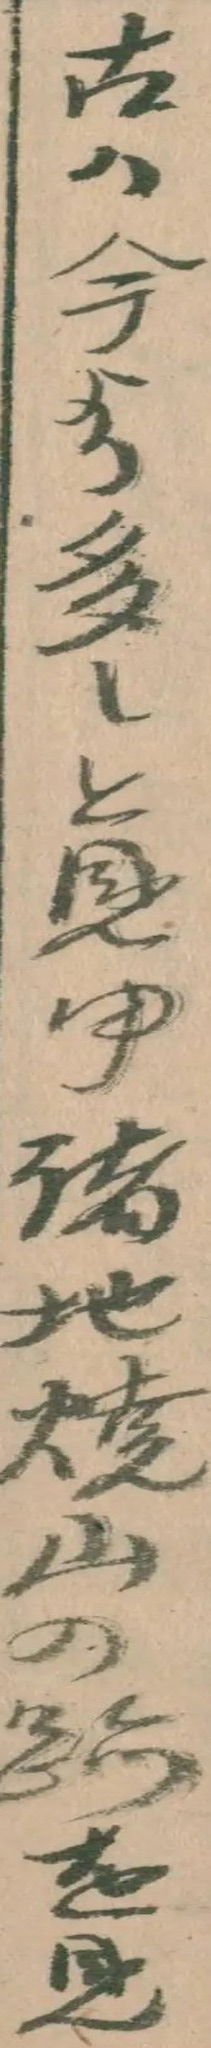古は今より多しと見ゆ諸地焼山の跡を見
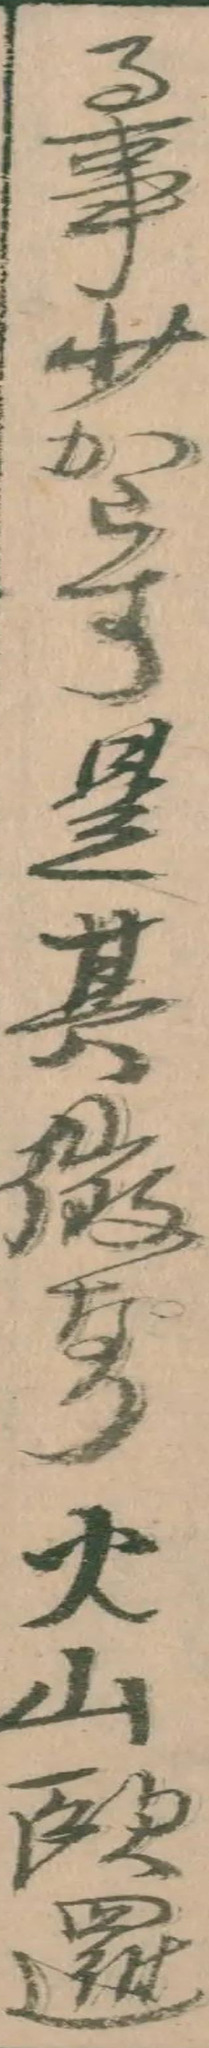る事少からす是其徴なり火山欧邏
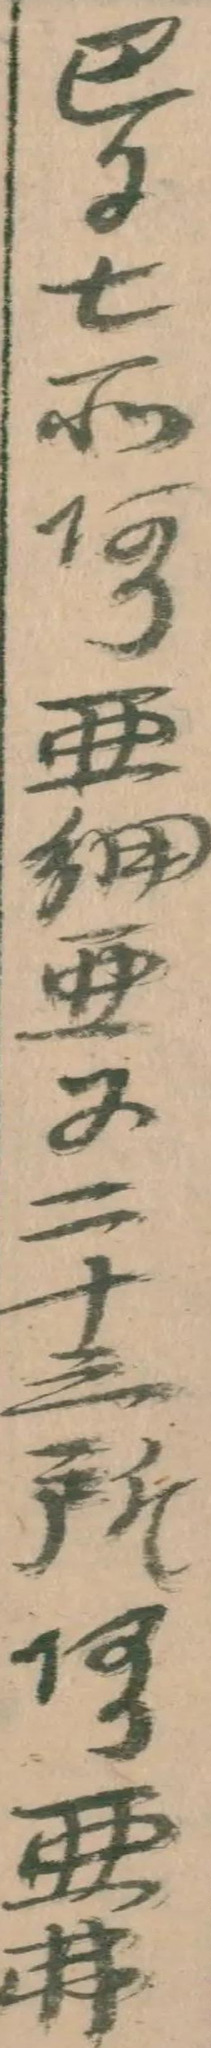巴に七所あり亜細亜に二十三所あり亜弗
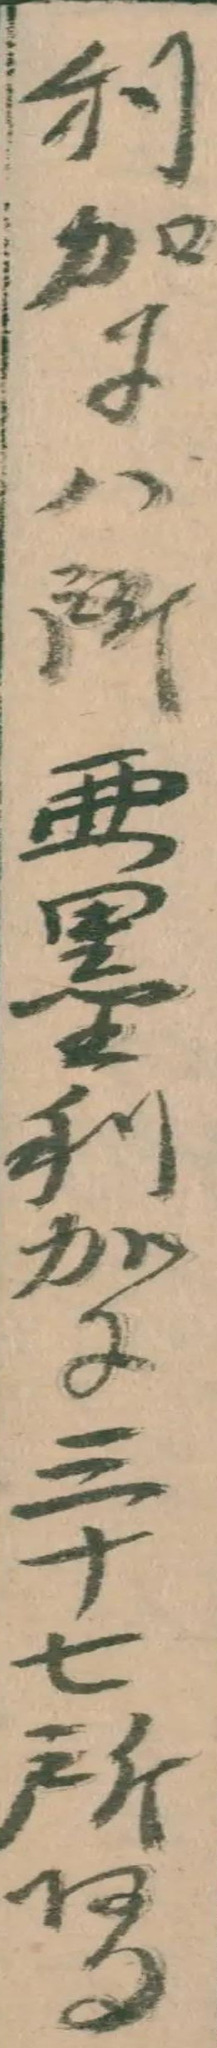利加に八所亜墨利加に三十七所ある
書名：新釈輿地図説
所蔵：国立国会図書館 National Diet Library, JAPAN
